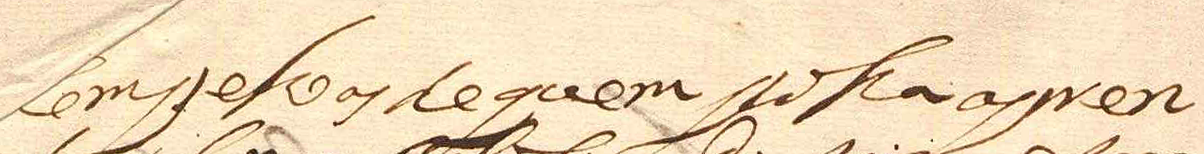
Com pesoas de quem possa apren
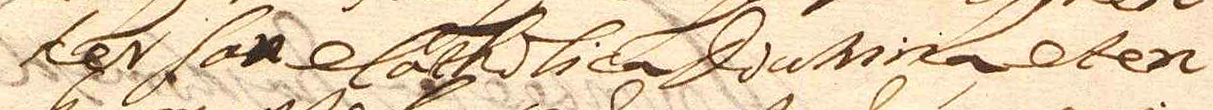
der san e Catholica Doutrina e ten
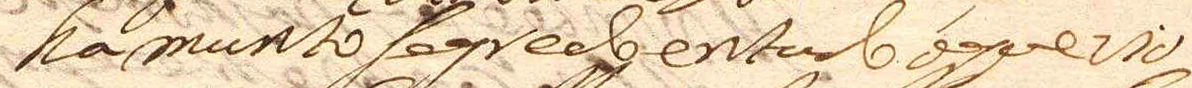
ha munto segredo en tudo o que vio
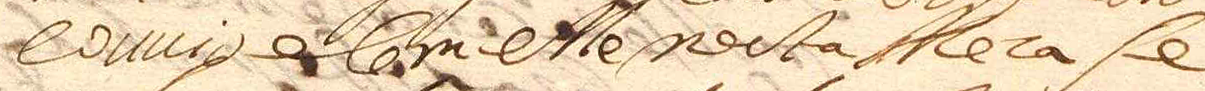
e ouuio e Com elle nesta Meza se
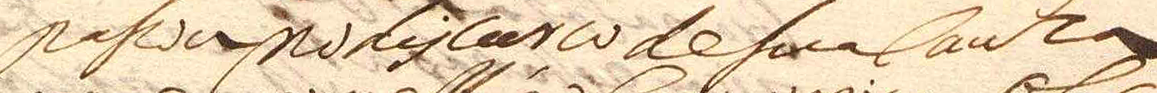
passou no discurço de sua Cauza
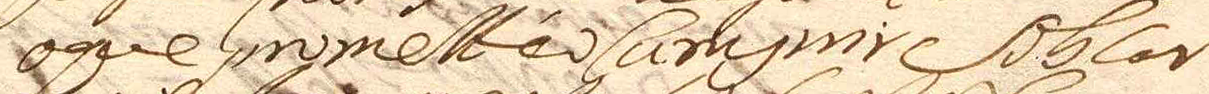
o que prometteo Cumprir Sob Car
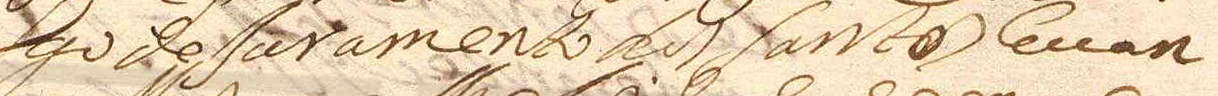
go do Juramento dos santos Euan
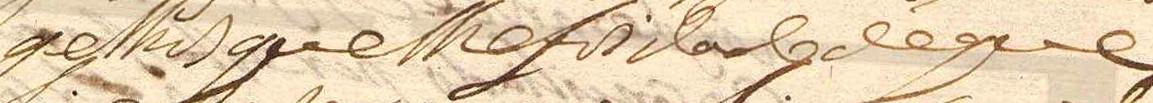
gelhos que lhe foi dado de que
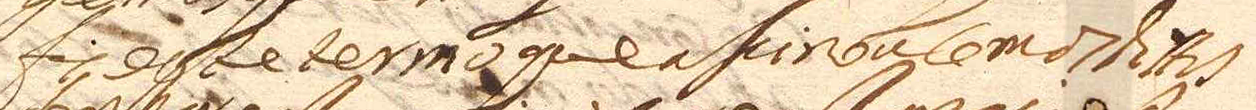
fis este termo que assinou com os dittos
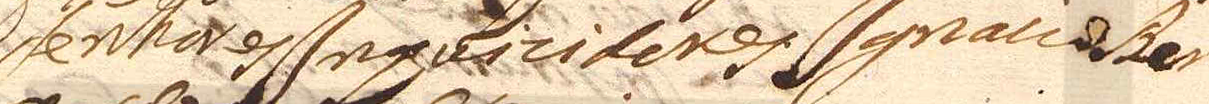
senhores Jnquizidores Jgnacio Ber
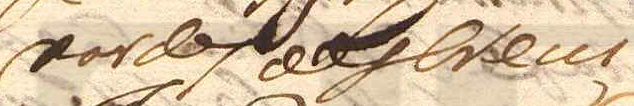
nardes o escreui
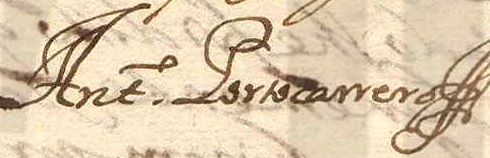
Ant.o Portocarrero
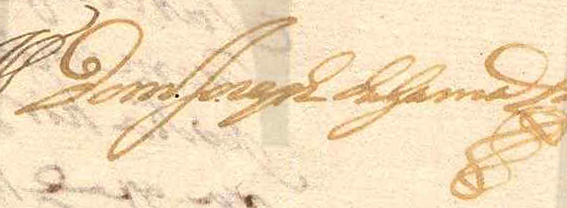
Dom Jozeph da Gama
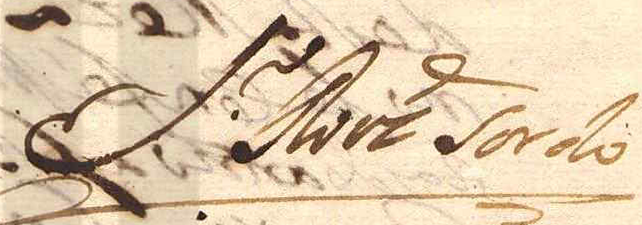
I.o. Roiz̄ Sordo
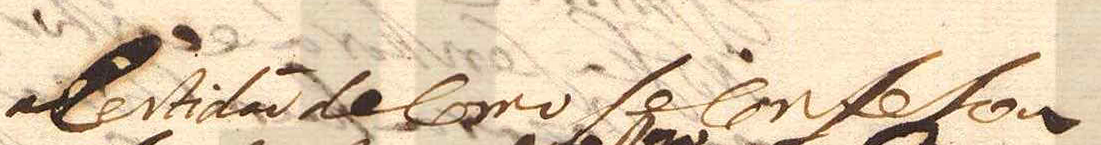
a Certidaõ de Como se confessou
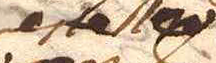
este Reo
